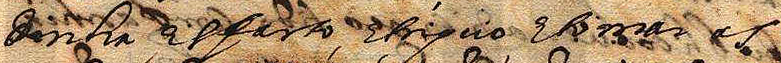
dinha, Esparto, E triguo, E tomar as
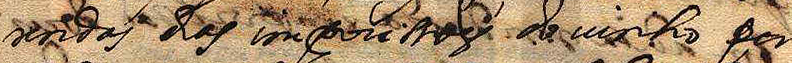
rendas das impozissoẽs do uinho por
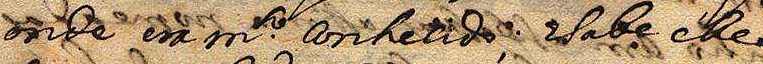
onde era m.to conhecido; E sabe elle
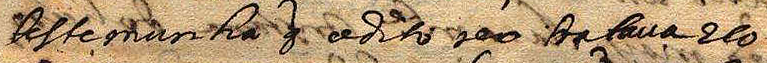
testemunha q̄ o dito reo trataua E co
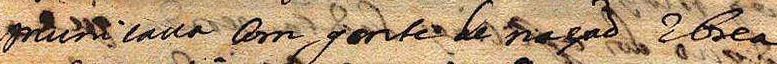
municaua com gente de nação Ebrea
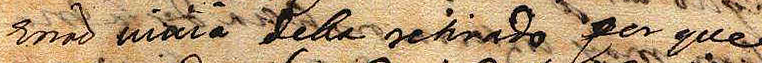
E não uiuia della retirado, per que
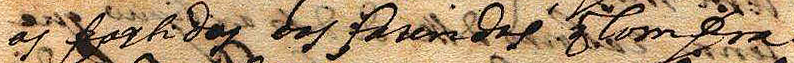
as partidas das fazendas q̄ Compra
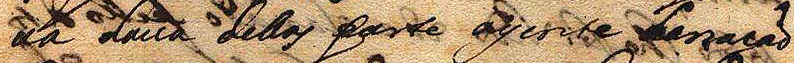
ua daua dellas parte a gente de naçaõ
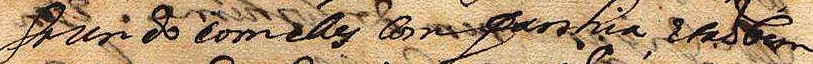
fazendo com elles companhia, E taõbem
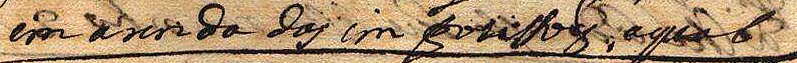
em a renda das impozissoẽs, a qual
